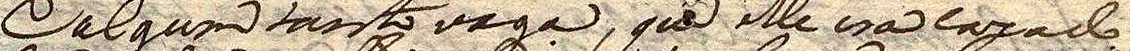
E algum tanto vaga, qu_ elle era cazado.
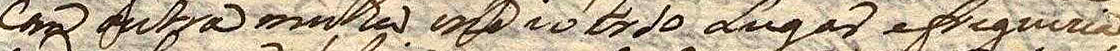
com outra mulher em outro Lugar e freguezia,
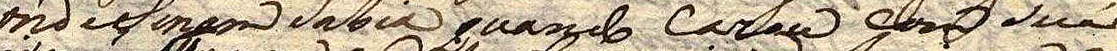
onde Senam sabia quando Cazou com sua
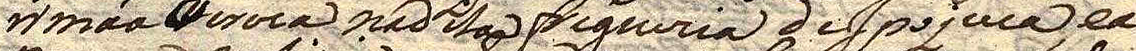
irmãa Tereza na dita freguezia de Jpojuca, e a
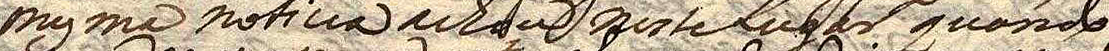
mesma noticia achou neste Lugar quando
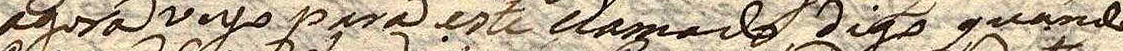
agora veyo para este chamado, digo quando
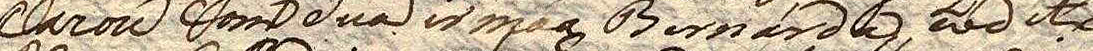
cazou com sua irmãa Bernarda, e o dito
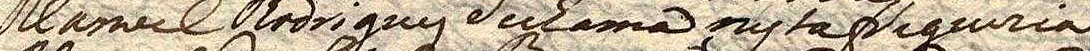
Manoel Rodrigues se chama nesta freguezia
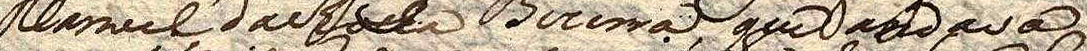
Manuel da Rocha Bezerra, que andava
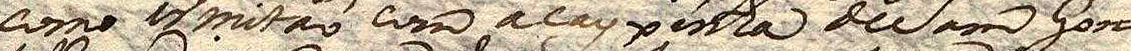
como irmitaõ com a cayxinha de Sam Gon
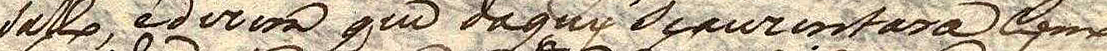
sallo, e dizem que daquy se auzentara como
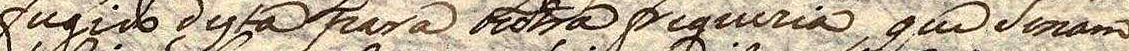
fugido desta para aoutra freguezia, que senam
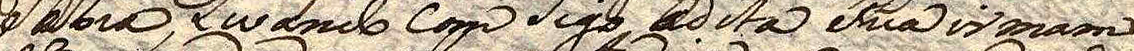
sabia, Levando comsigo a dita sua irmam
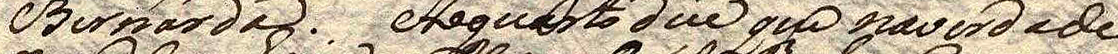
Bernarda. Ao quarto dice que na verdade
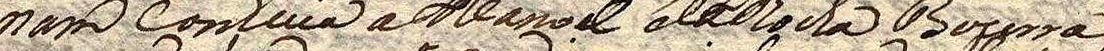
nam conhecia a Manoel da Rocha Bezerra
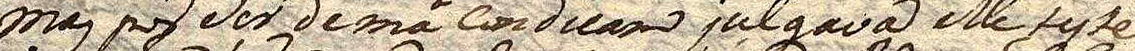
mas por ser de mã condicam julgava elle teste
